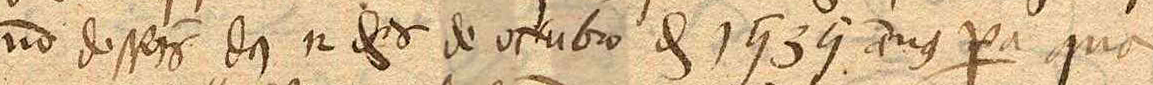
n̄o despojs dꝯ 12 djas de octubro dj 1535 ānꝯ ꝑa qua
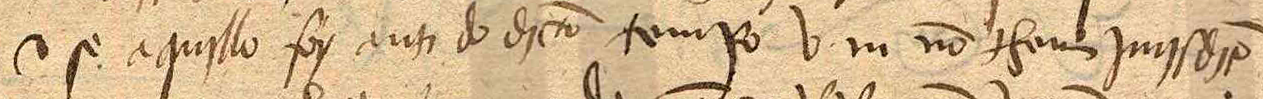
e se aqujllo foy anti do djc̄to tempo v. m. n̄o them Jurjsdjc̄o
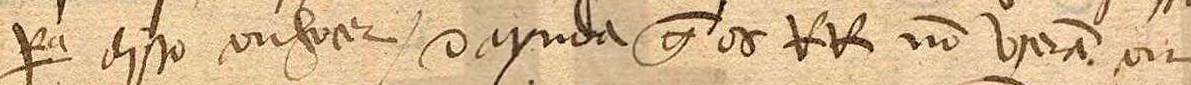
ꝑa djsso conhocer / e aynda q̄ os RR nō vjerā com
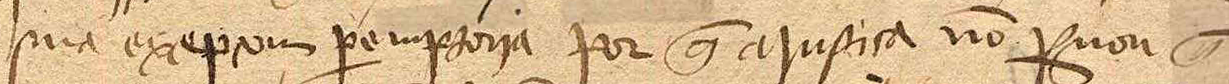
sua excepcom ꝑemptorja porq̄ a Justica nō ꝓuou q̄
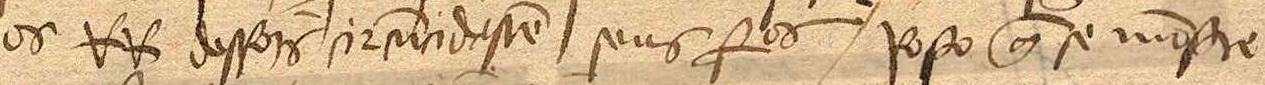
os RR despojs circ̄ucidassē seus fos / posto q̄ se mōstre
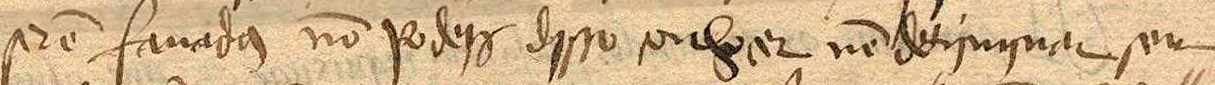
serē fanadꝯ nō podejs djsso conhocer nē detrjmjnar sem
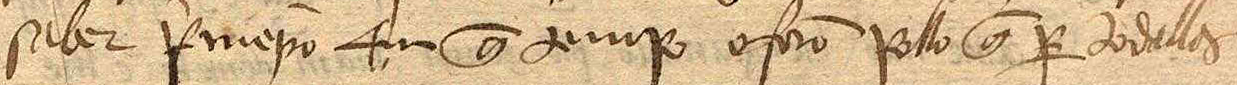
saber p̄mejro Em q̄ tempo o forō pollo q̄ ꝑ todallas
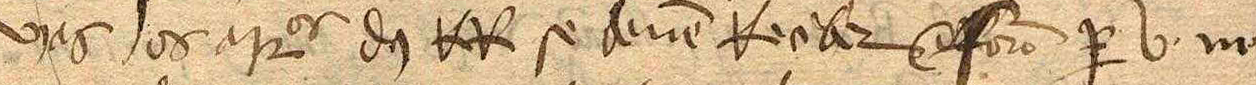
vjas os artos dꝯ RR se deuē Receber e forō ꝑ v. m.
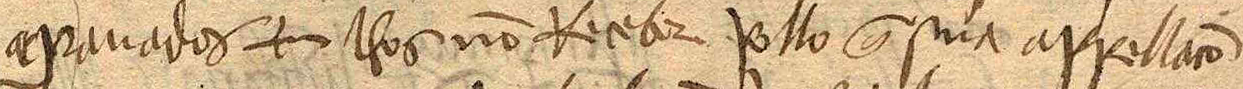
agrauados Em lhos nō Receber pollo q̄ sua appelaç̄o
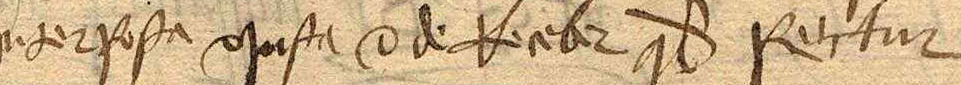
jnterposta e justa e de Receber qd' petitur
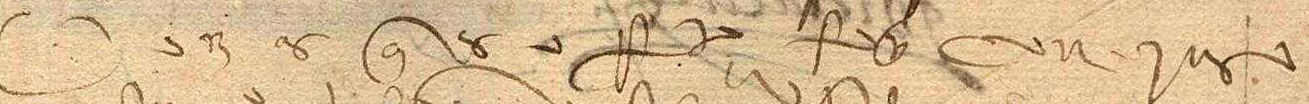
Com as q̄es o fto foy concruso
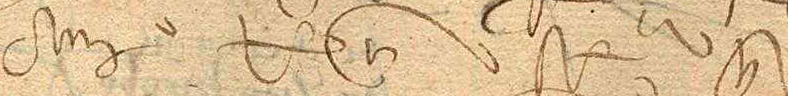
Anto Roīz o spivy
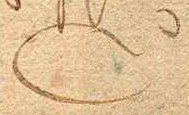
Co
